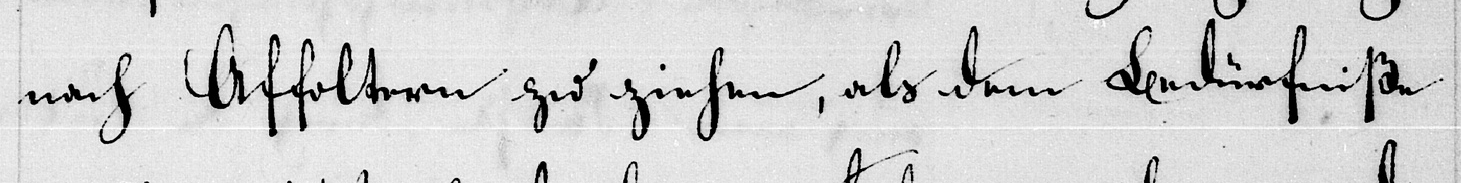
nach Affoltern zu ziehen, als dem Bedürfniße
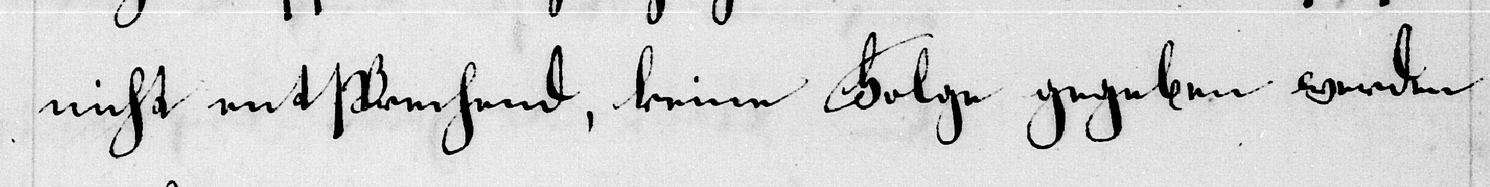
nicht entsprechend, keine Folge gegeben werden
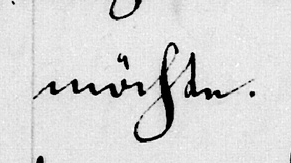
möchte.
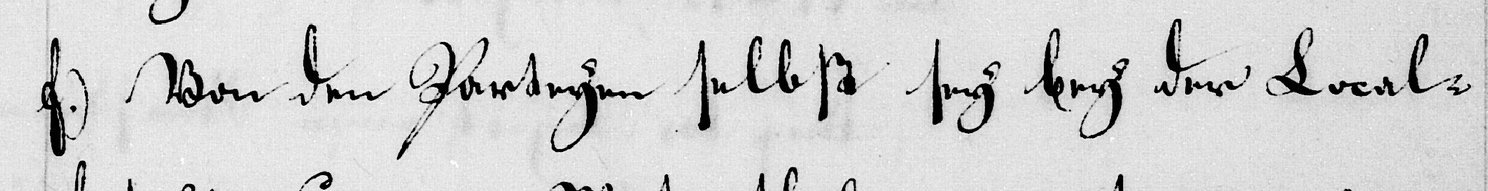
f.) Von den Parteyen selbst sey bey der Local¬
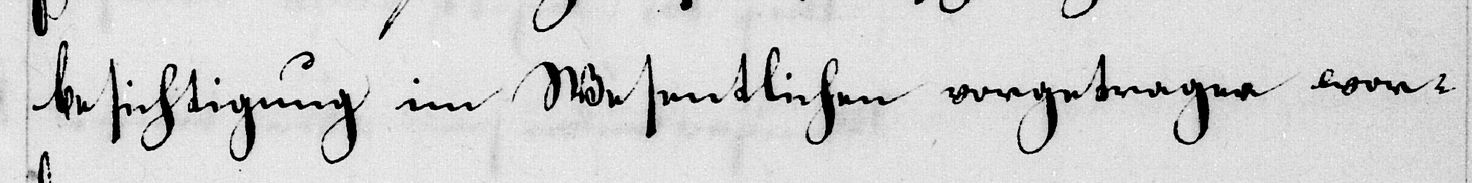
besichtigung im Wesentlichen vorgetragen wor¬
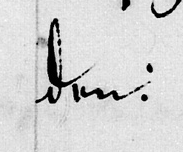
den:
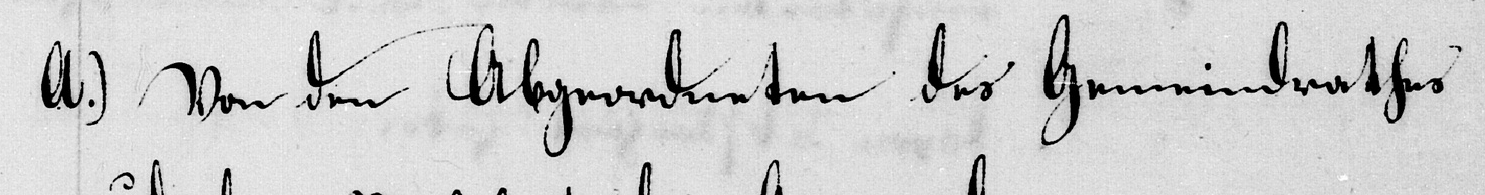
A.) Von den Abgeordneten des Gemeindrathes
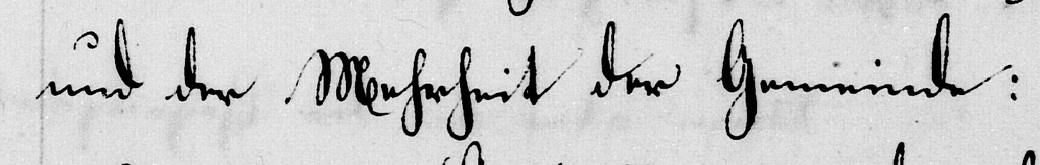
und der Mehrheit der Gemeinde:
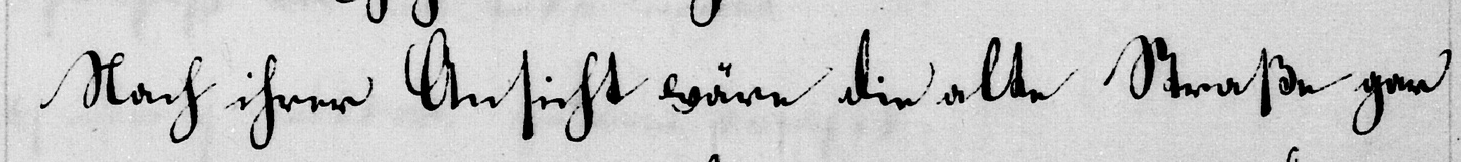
Nach ihrer Ansicht wäre die alte Straße gar
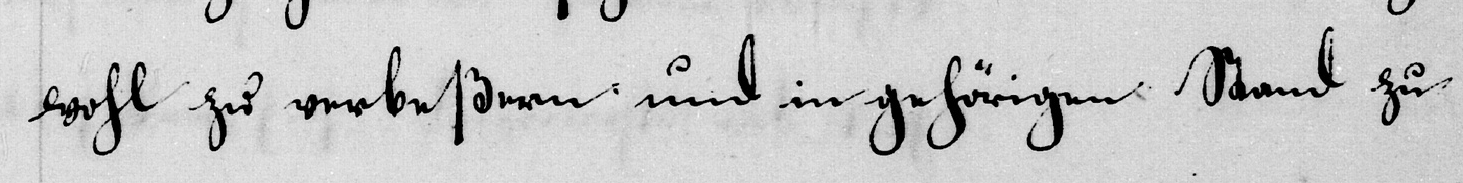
wohl zu verbeßern und in gehörigen Stand zu
